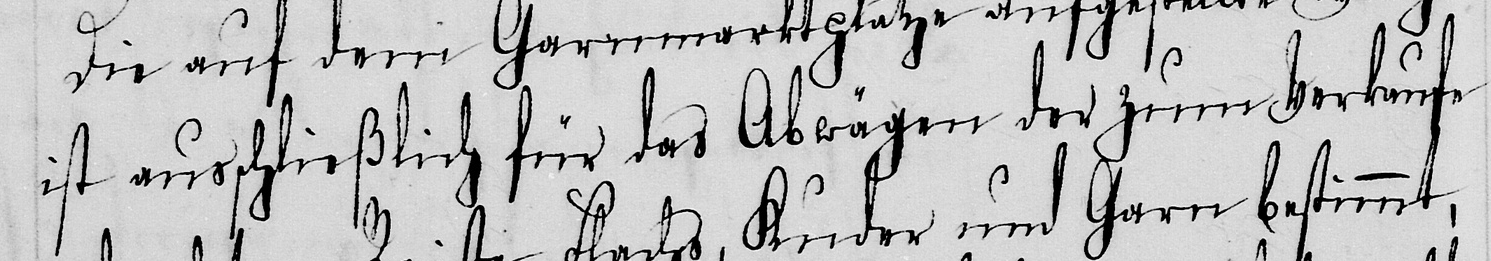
ist ausschließlich für das Abwägen der zum Verkaufe
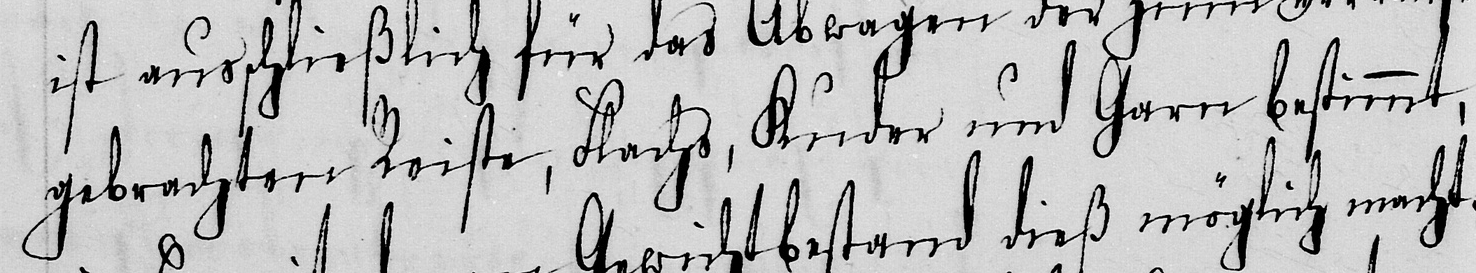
gebrachten Reiste, Flachs, Kuder und Garn bestimmt,
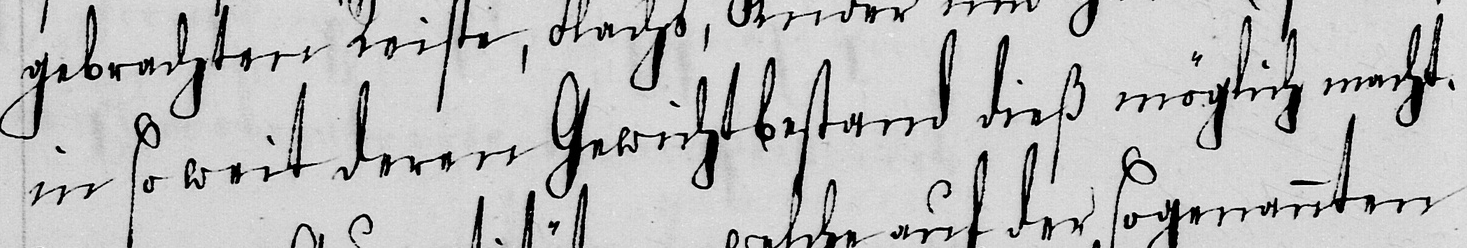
in so weit deren Gewichtbestand dieß möglich mach¬
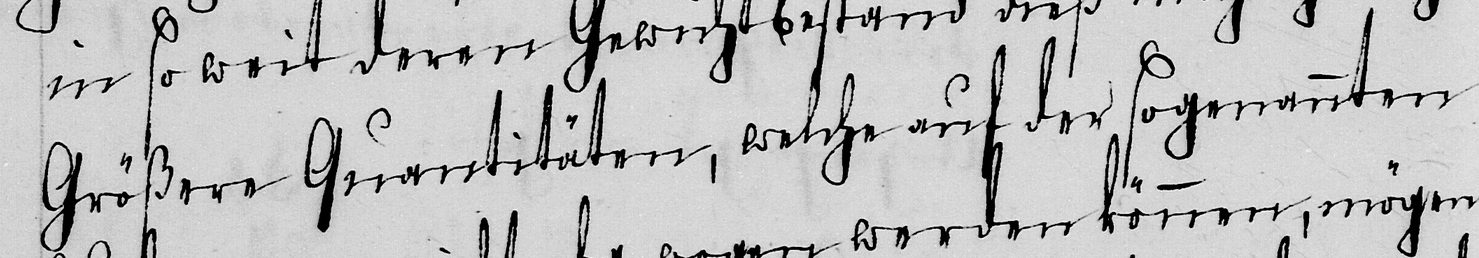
Größere Quantitäten, welche auf der sogenannten
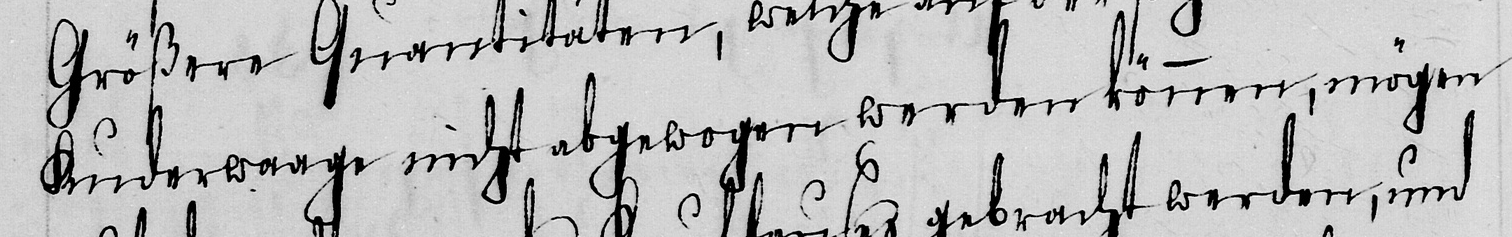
Kuderwaage nicht abgewogen werden können, mögen
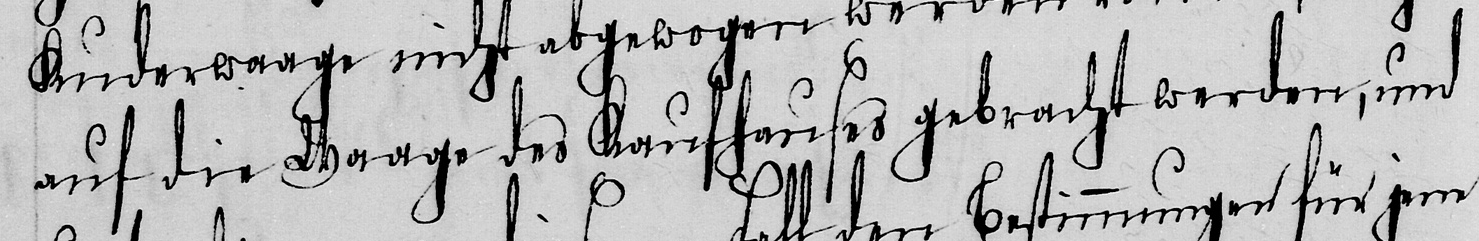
auf die Waage des Kaufhauses gebracht werden, und
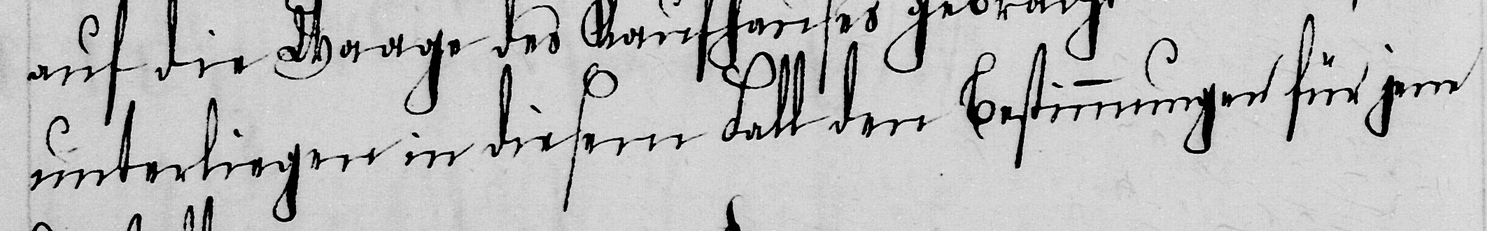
unterliegen in diesem Fall den Bestimmungen für jene
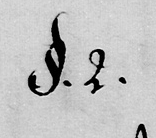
§. 2.
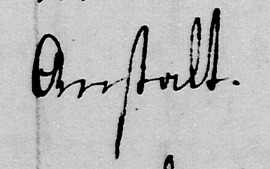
Anstalt.
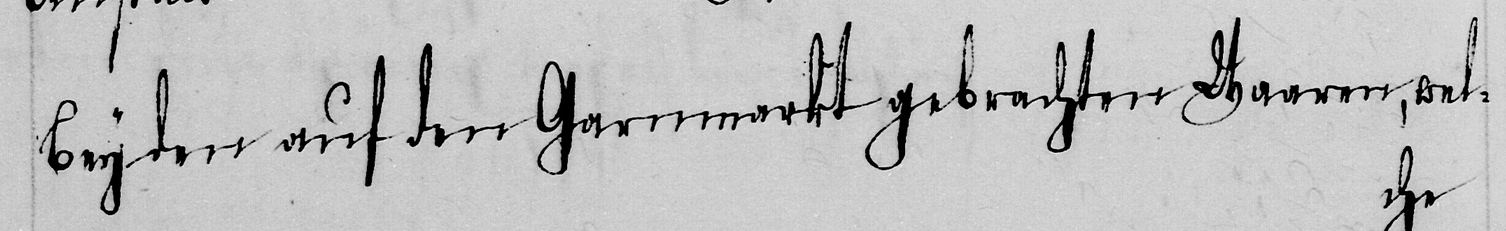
Beyden auf den Garnmarkt gebrachten Waaren, wel-
